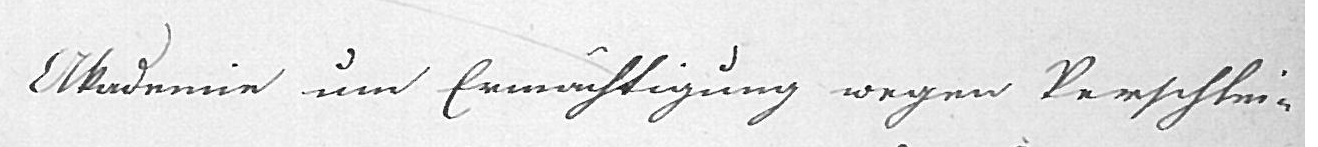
Akademie um Ermächtigung wegen Verschlei-
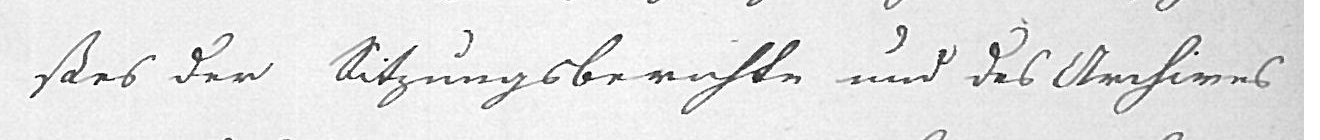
ßes der Sitzungsberichte und des Archives
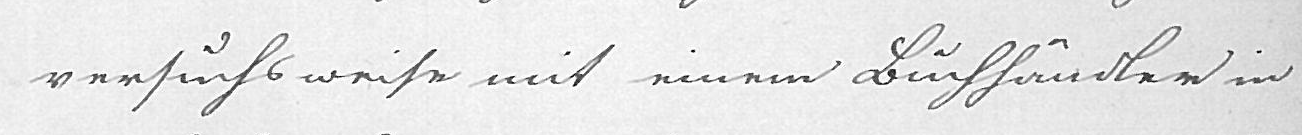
versuchsweise mit einen Buchhändler in
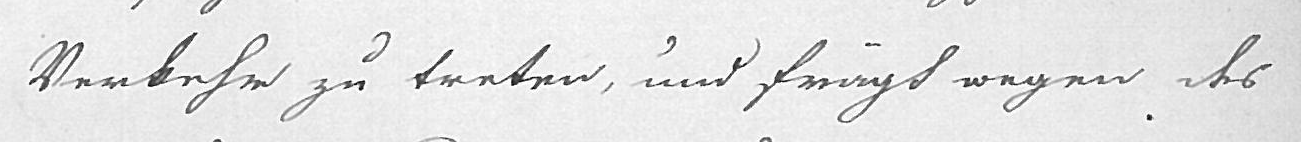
Verkehr zu treten, und fragt wegen des
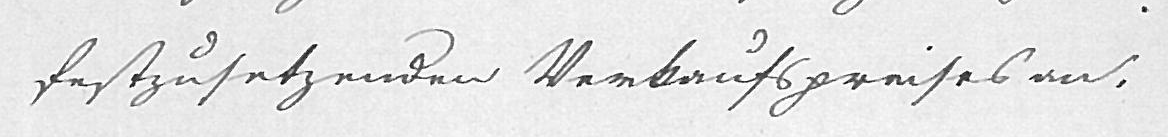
festzusetzenden Verkaufspreises an.
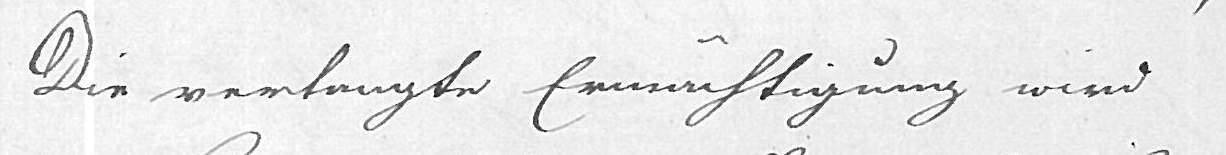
Die verlangte Ermächtigung wird
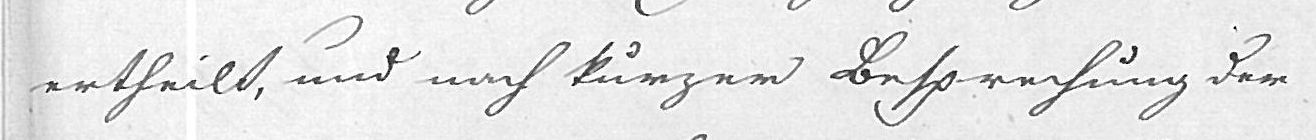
ertheilt, und nach kurzer Besprechung der
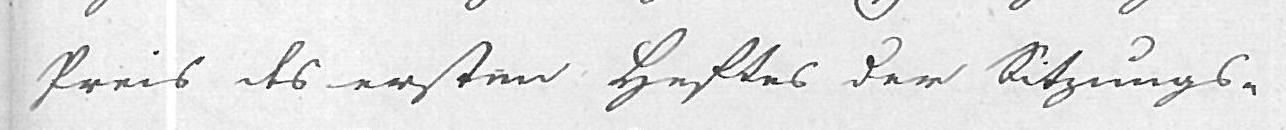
Preise des ersten Heftes der Sitzungs-
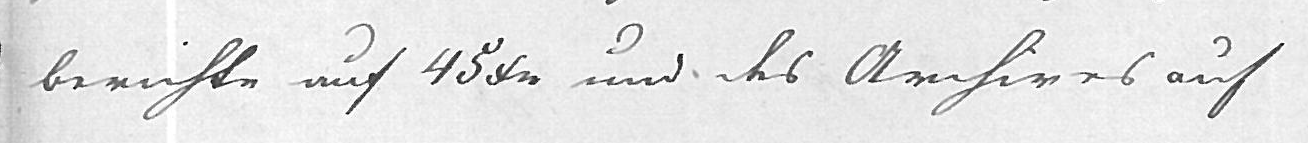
berichte auf 45 kr und des Archives auf
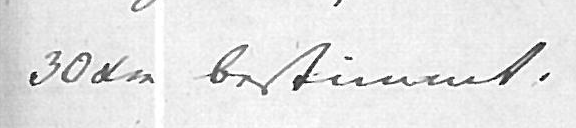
30 kr bestimmt.
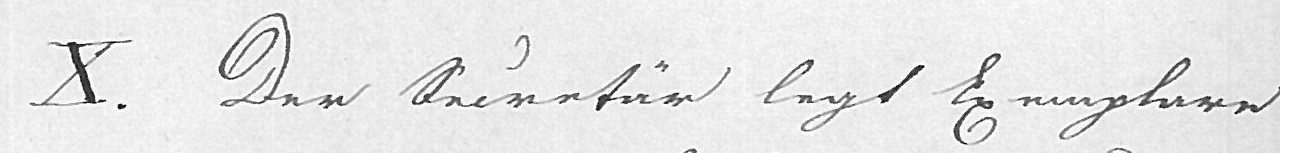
X. Der Secretär legt Exemplare
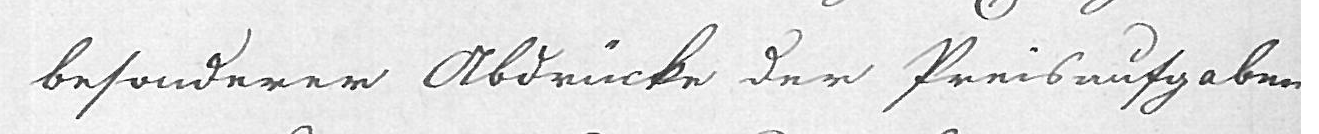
besonderer Abdrücke der Preisaufgaben
